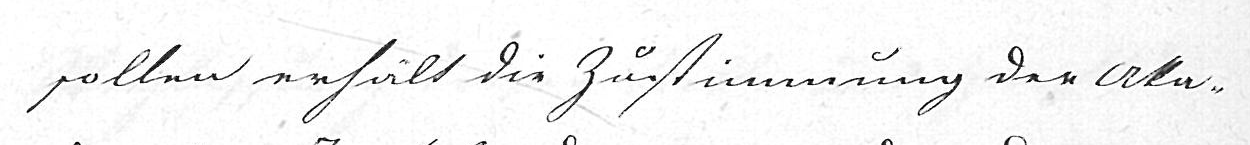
sollen erhält die Zustimmung der Aka-
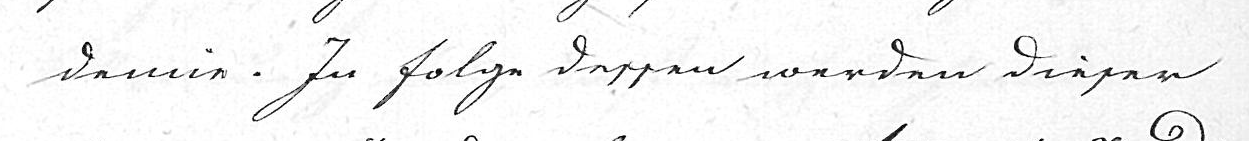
demie. In Folge dessen werden dieser
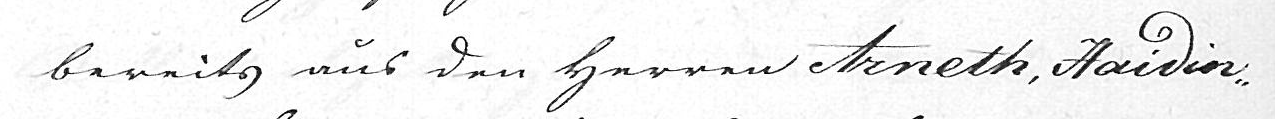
bereits aus den Herren Arneth, Haidin-
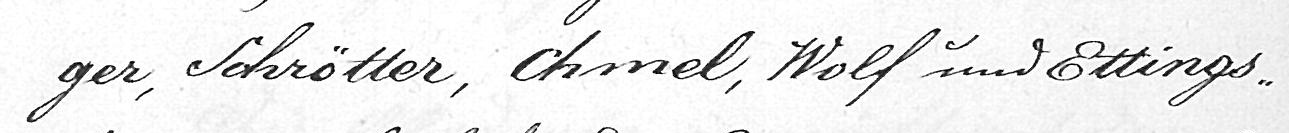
ger, Schrötter, Chmel, Wolf und Ettings-
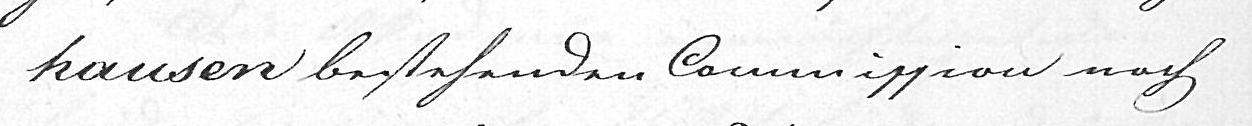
hausen bestehenden Commission noch
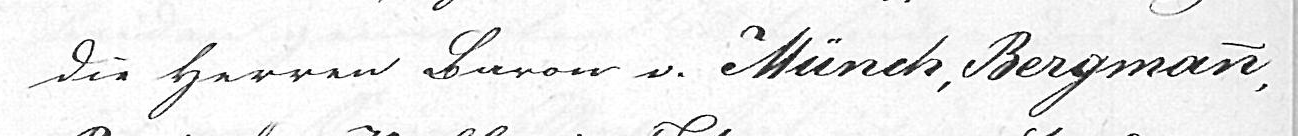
die Herren Baron v. Münch, Bergmann,
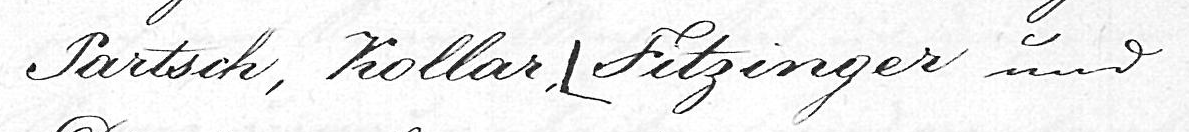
Partsch, Kollar, Fitzinger und
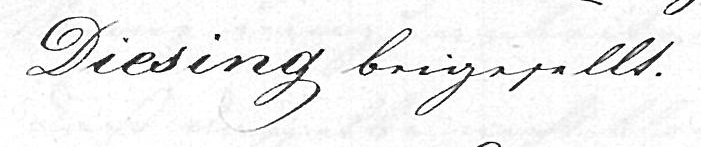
Diesing beigesellt.
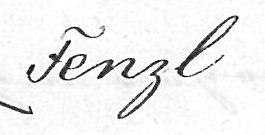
Fenzl
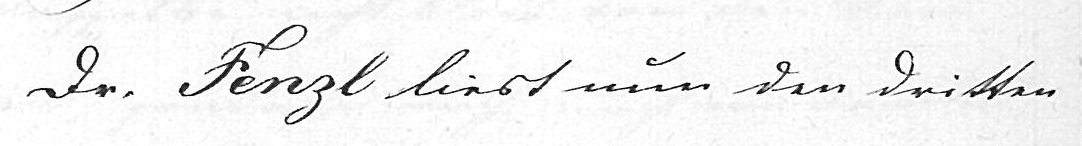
Dr. Fenzl liest nun den dritten
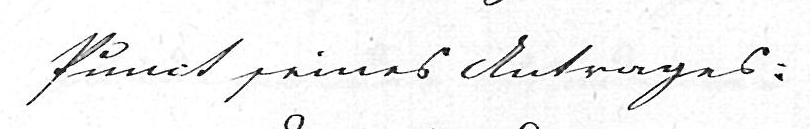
Punct seines Antrages:
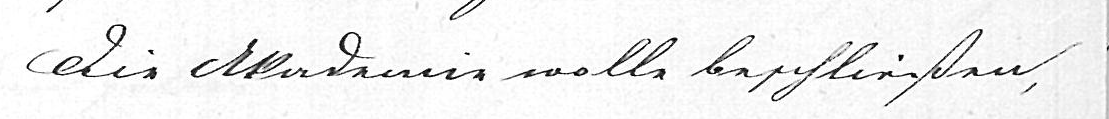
Die Akademie wolle beschließen,
